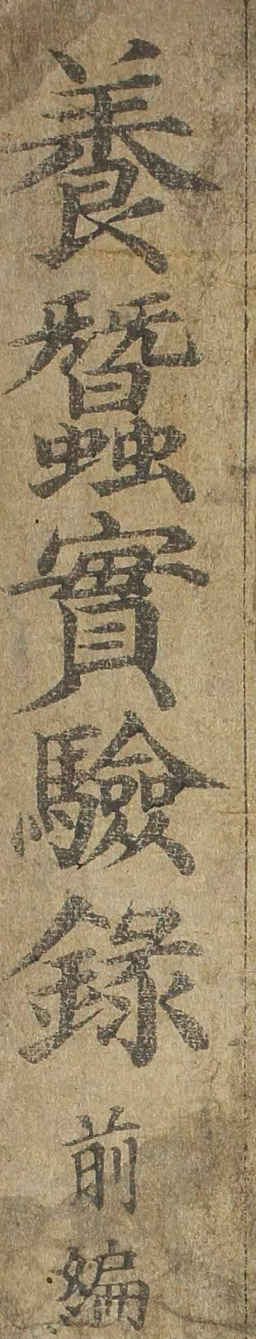養蠺實験録前編

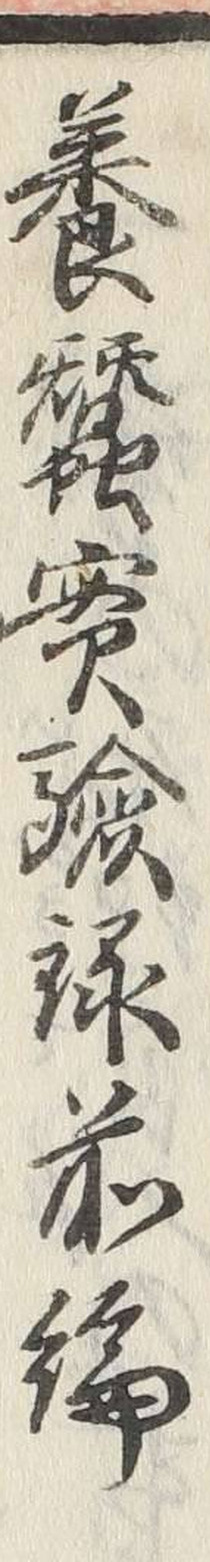養蠺實験録前編
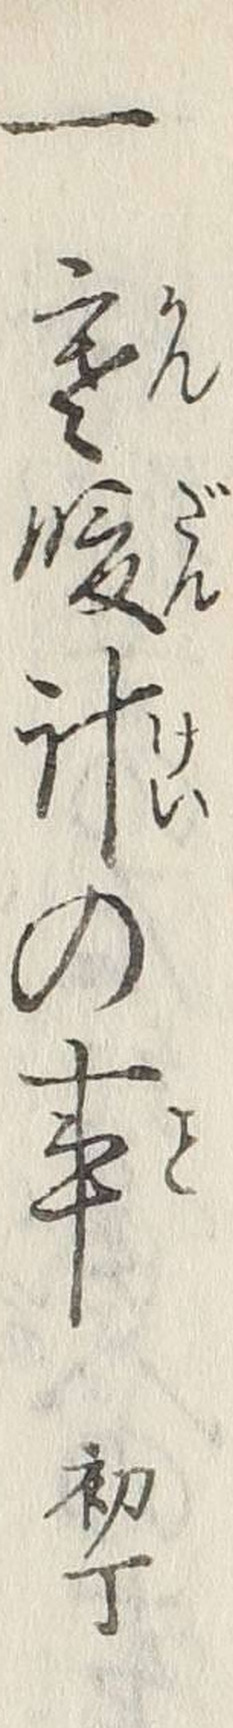一寒暖計の事初丁
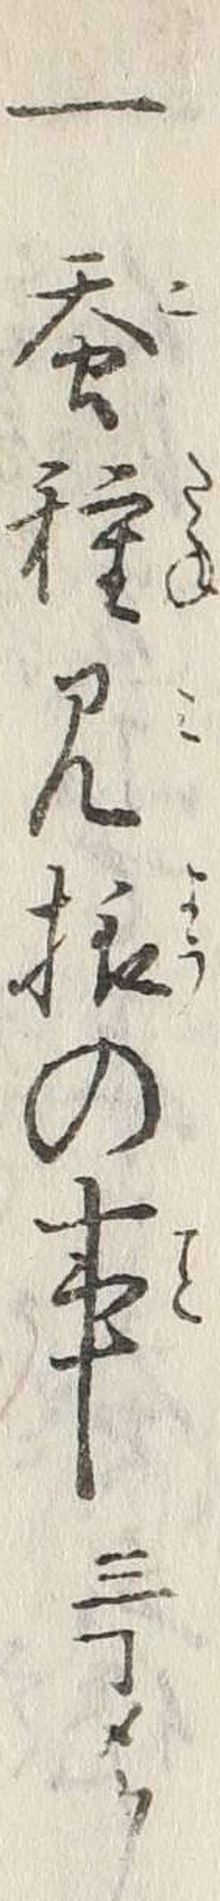一蚕種見様の事三丁メウ
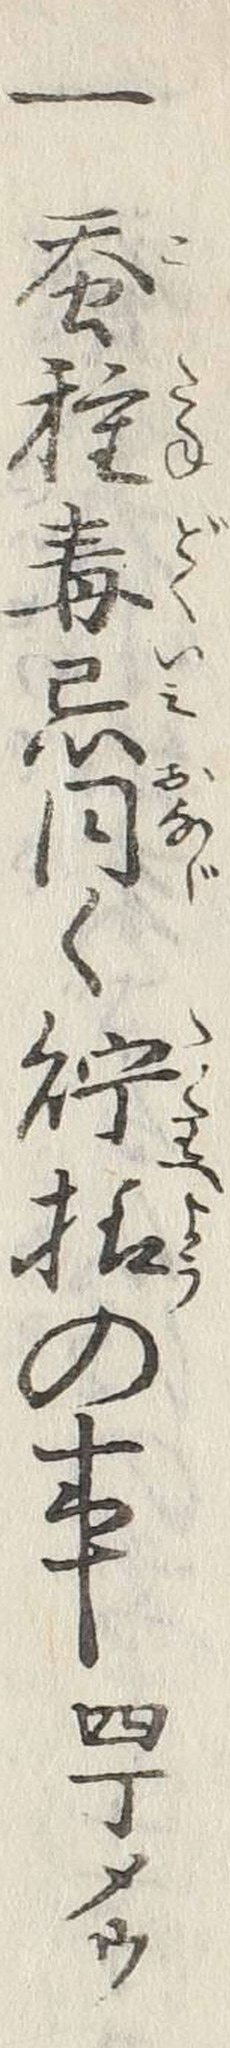一蚕種毒忌同く貯様の事四丁メウ
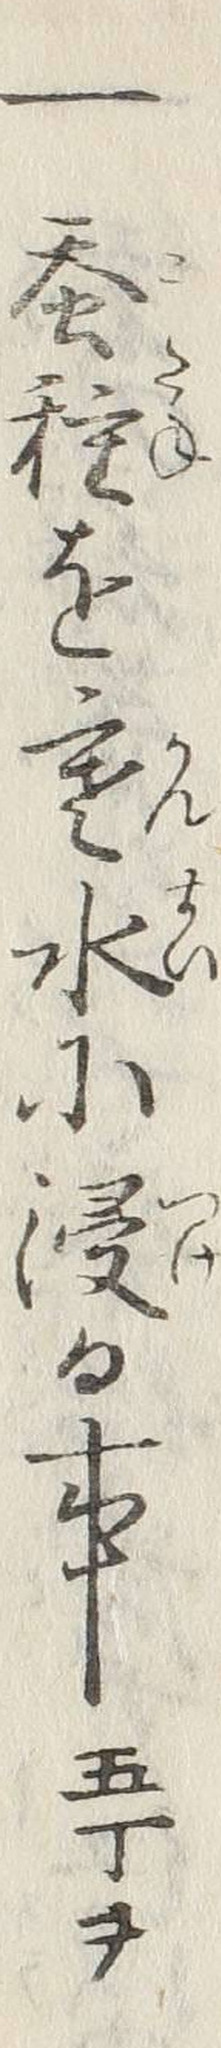一蚕種を寒水に浸る事五丁ヲ
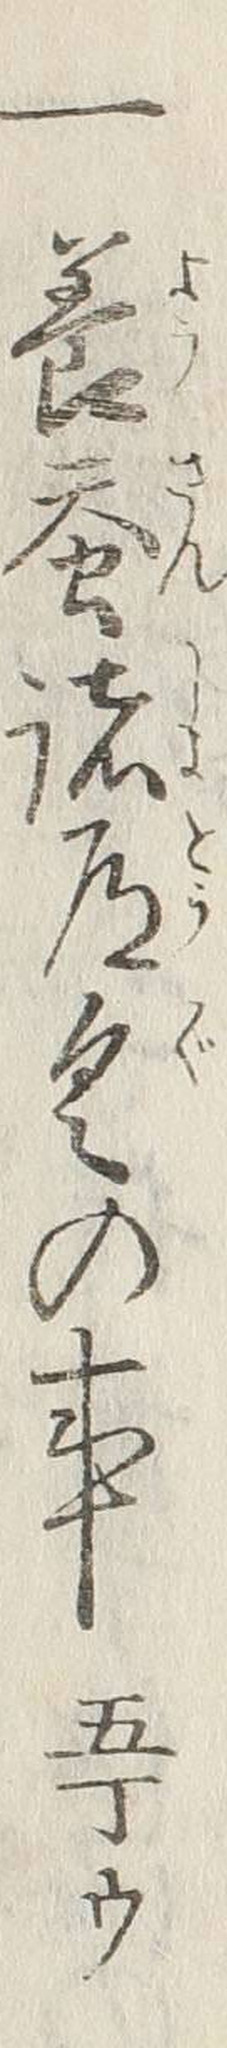一養蚕諸道具の事五丁ウ
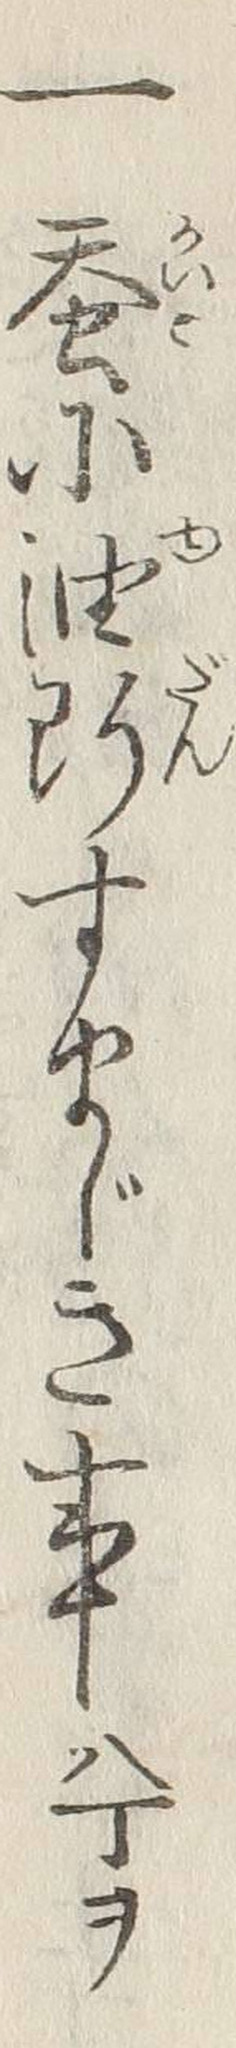一蚕に油断すまじき事八丁ヲ

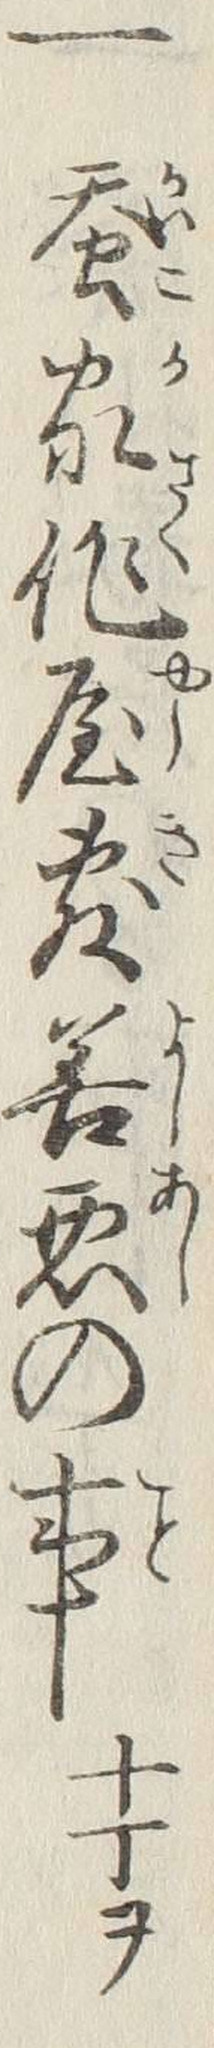一蚕家作屋敷善悪の事十丁ヲ
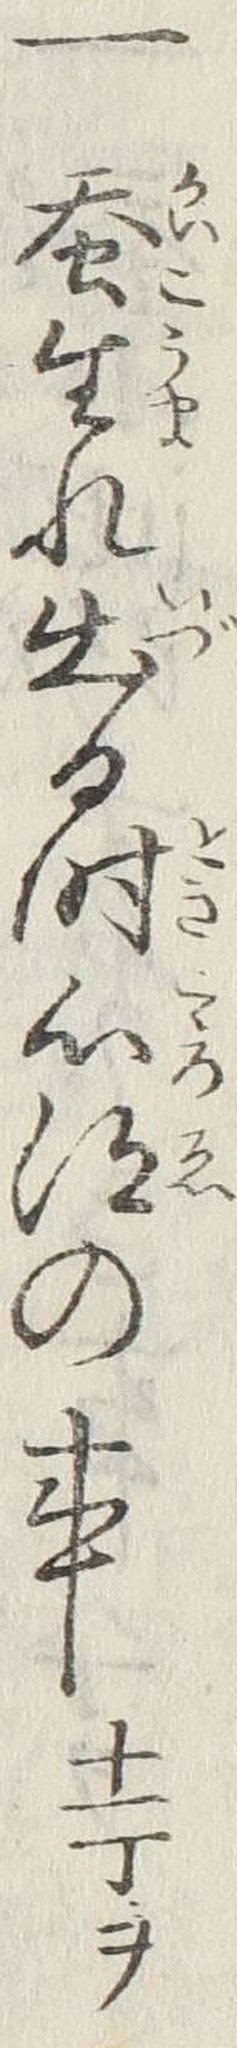一蚕生れ出る時心得の事十一丁ヲ
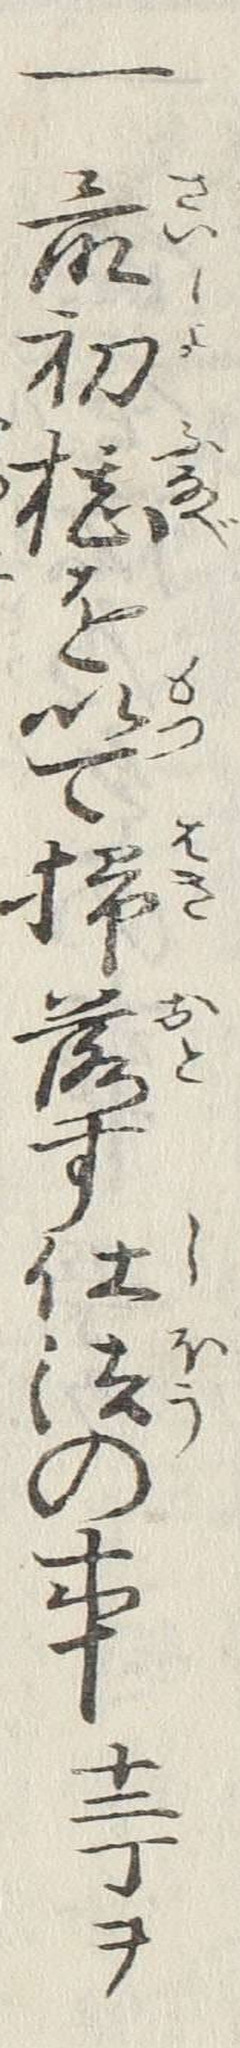一桒の若芽を以て蚕掃落す仕法の事十四丁ウ
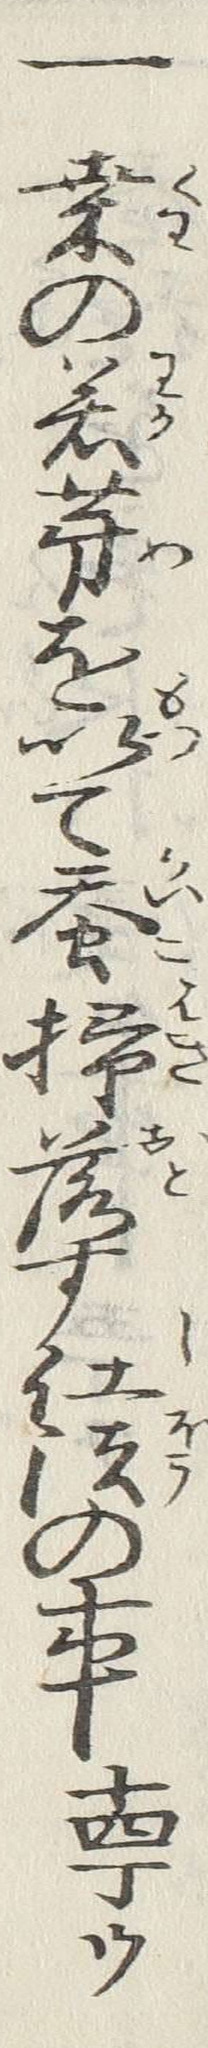一桒の若芽を以て蚕掃落す仕法の事十四丁ウ
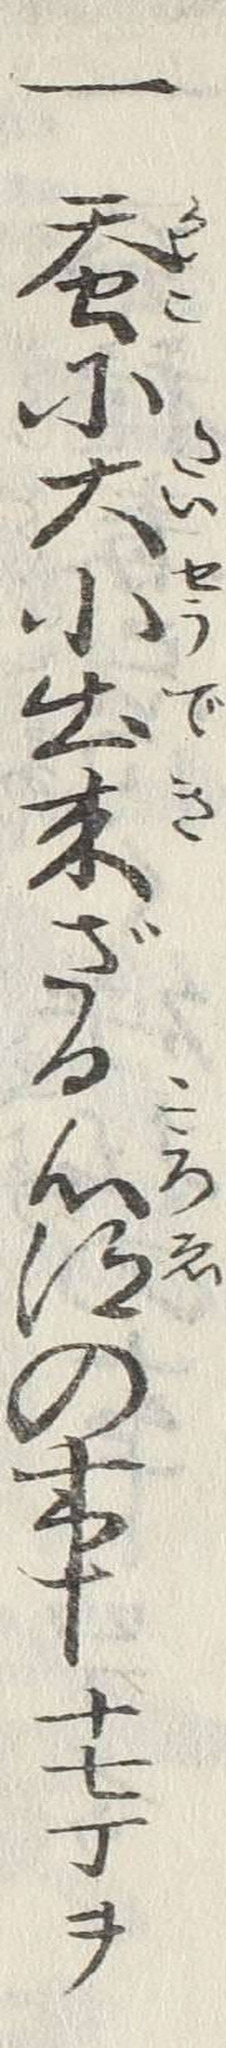一蚕に大小出来ざる心得の事十七丁ヲ
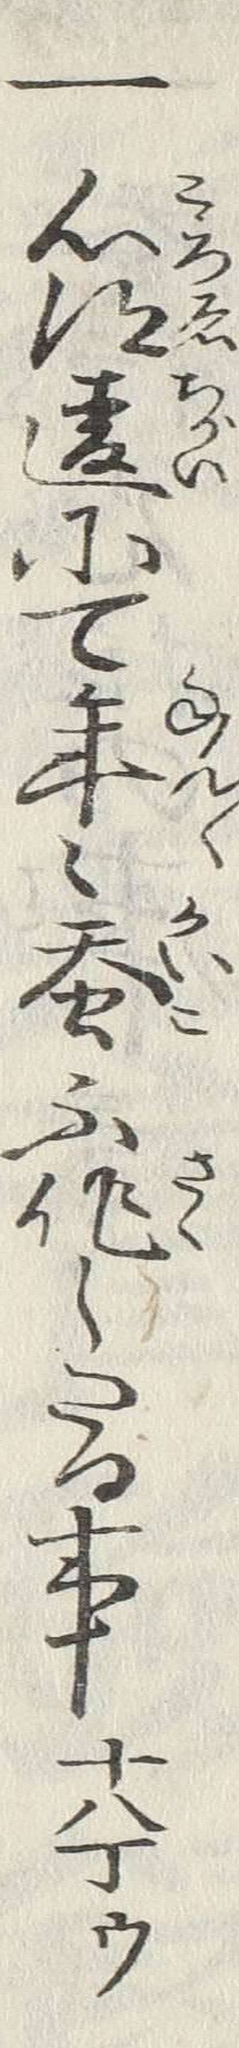一心得違にて年々蚕ふ作したる事十八丁ウ
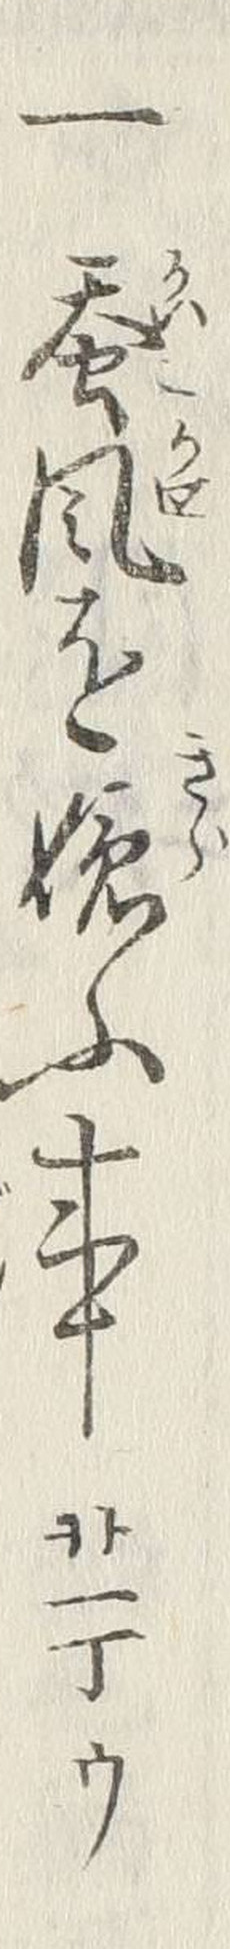一蚕風を嫌ふ事廿一丁ウ
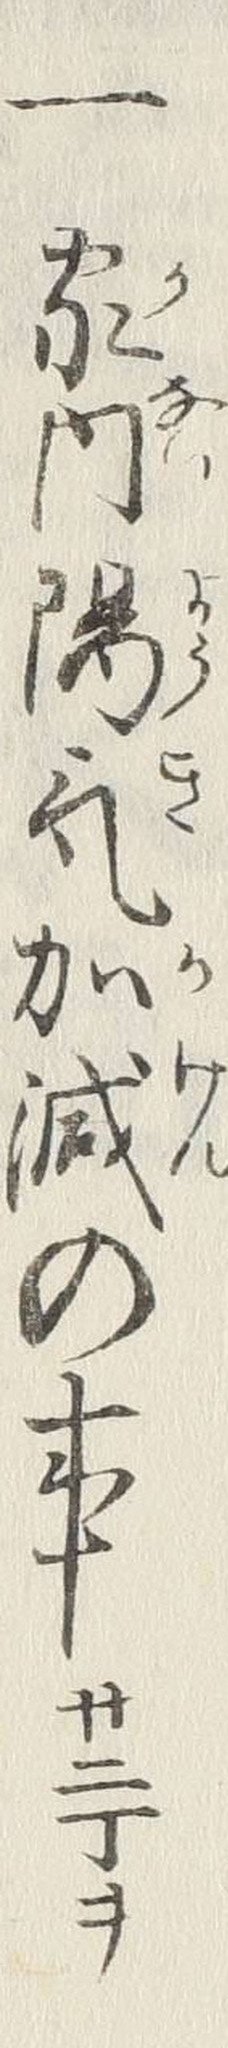一家内陽気加減の事廿二丁ヲ
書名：養蠶實驗録
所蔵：東京大学農学生命科学図書館 国文学研究資料館
